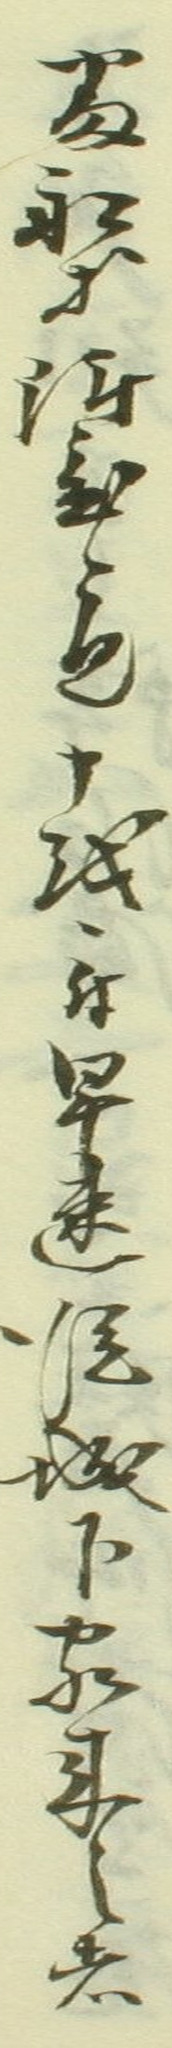番船等附置候通申越候付早速従城下家来之者
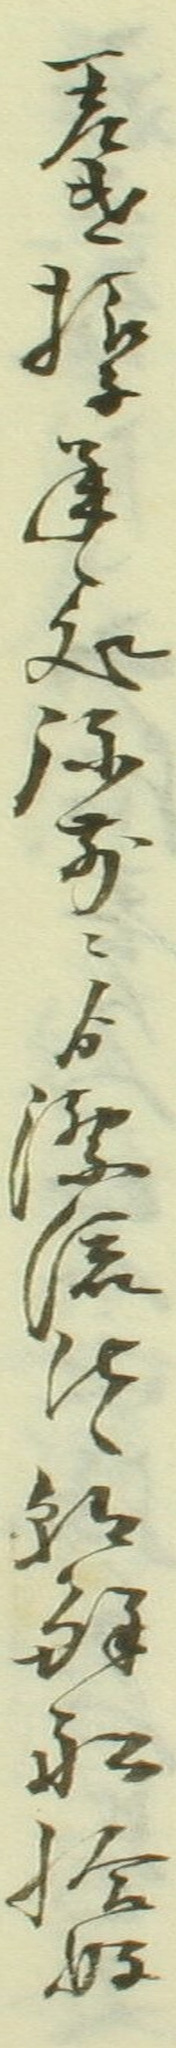差遣様に承候処弥前々ゟ漂流仕候朝鮮船恰好
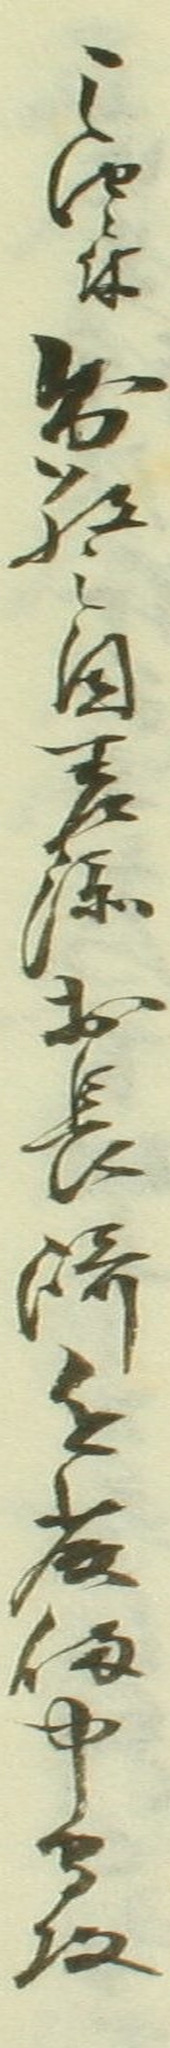之由ニ付則警固差添於長崎近藤備中守殿
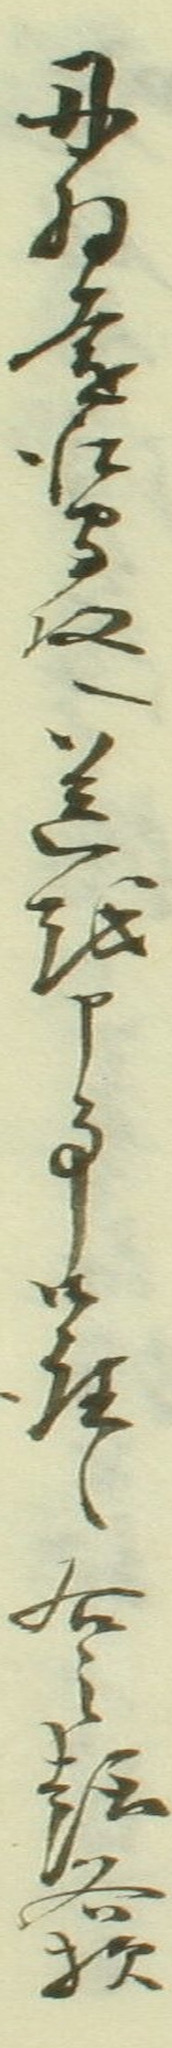丹羽遠江守殿へ送越申事御座候右之趣各様
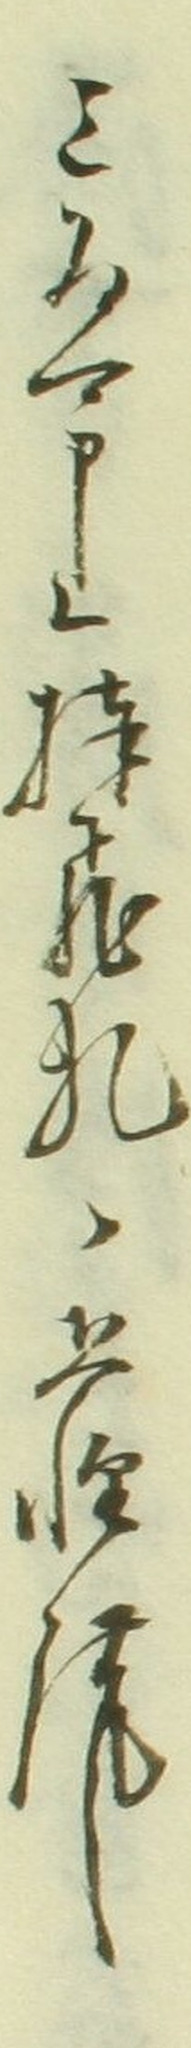迄為可申上捧飛札候恐惶謹言
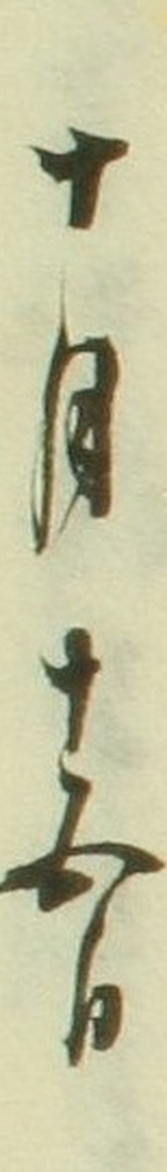十月十五日
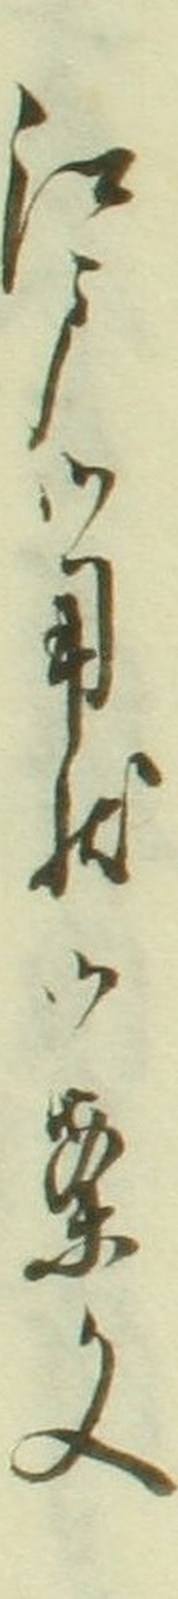江戸御用状御案文
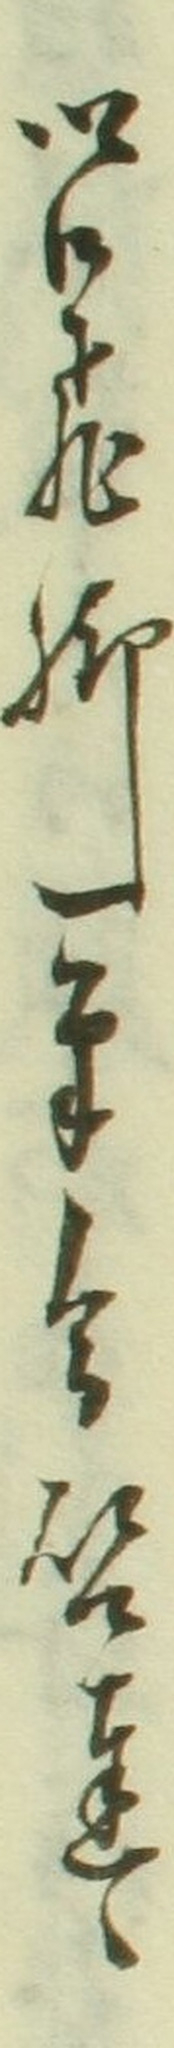以御飛脚一筆令啓達候
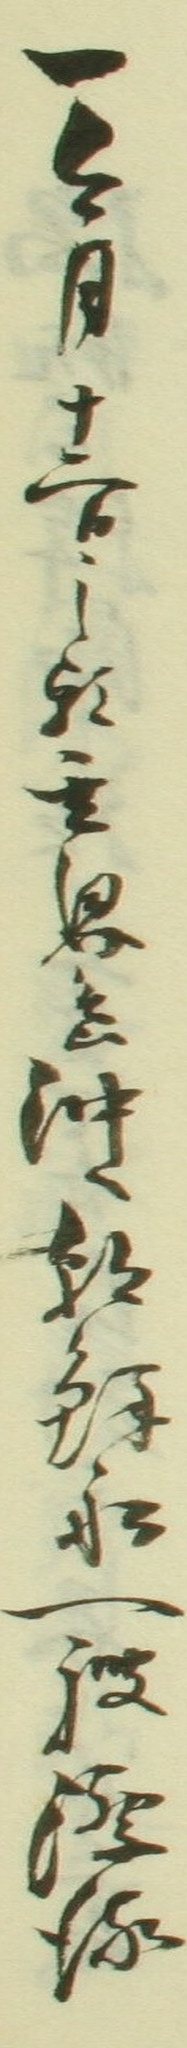一今月十二日之朝玄界嶋沖へ朝鮮船一艘漂流

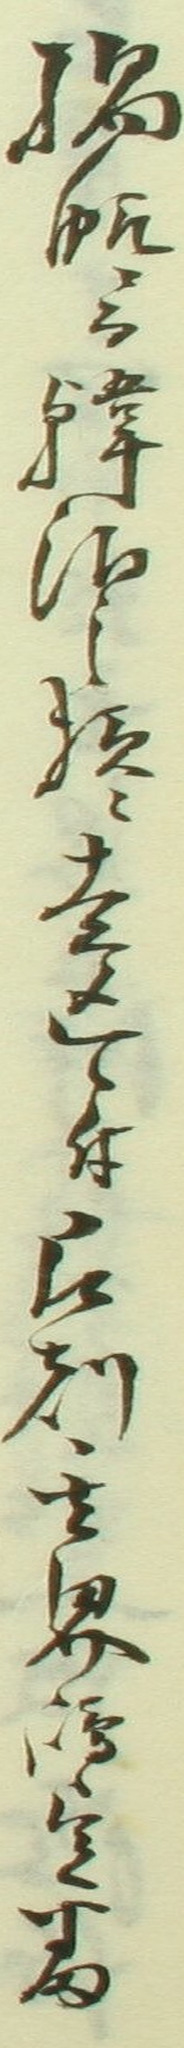縮帆ニ而韓泊之横ニ走込候付即刻玄界嶋定番
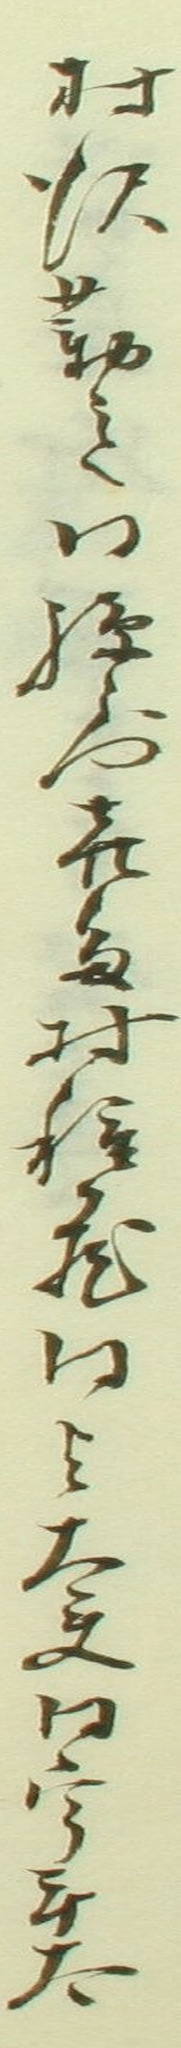村沢勤兵へ同孫右衛門喜多村権蔵同与太夫同宇平太
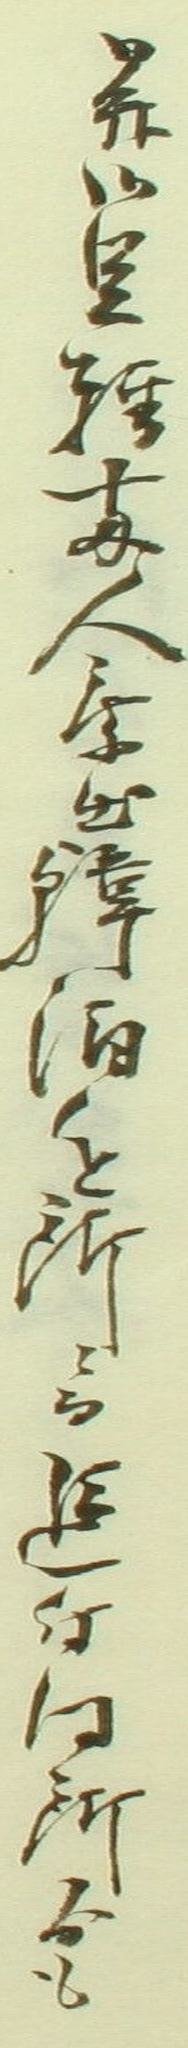并御足軽両人矩位で乗出韓泊近所ニ而追付同所ゟも
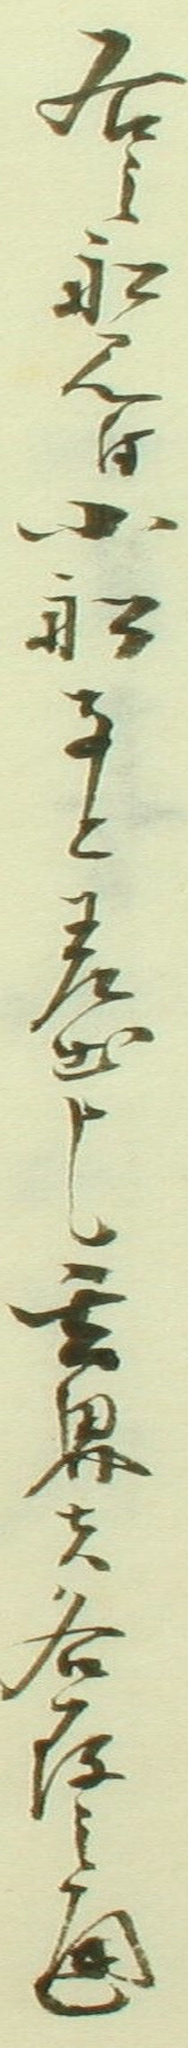右之船見付小船なと差出申候玄界者各存之通
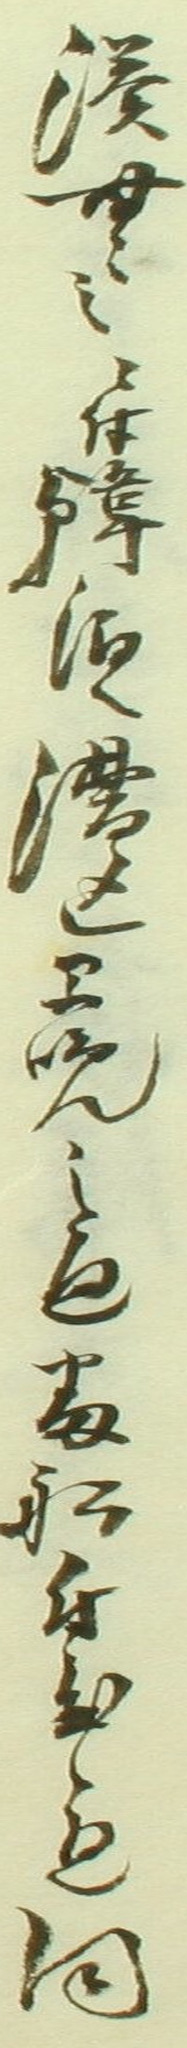湊無之ニ付韓泊へ漕込早晩之通番船付置候通同
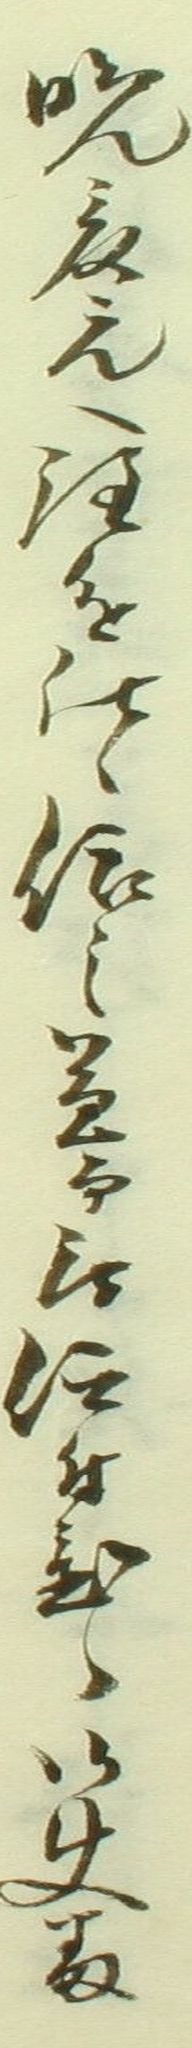番爰元へ注進仕候依之兼而被仰付置候御使番
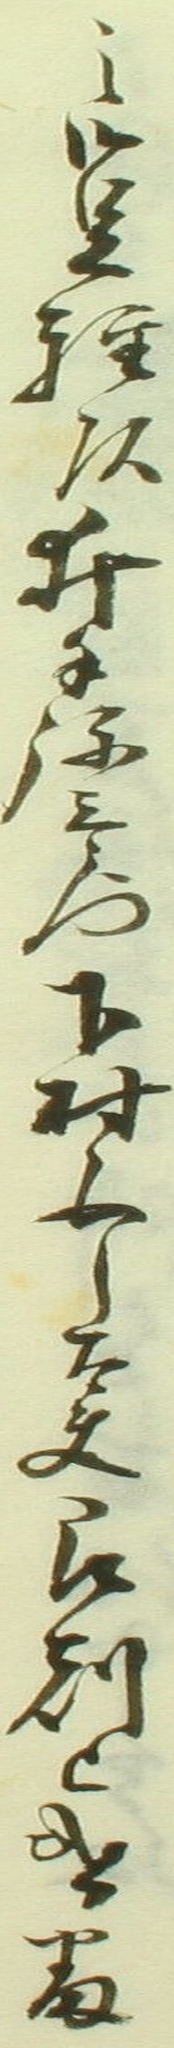之御足軽頭井手孫三右衛門下村五郎太夫即刻被遣番
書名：異国船漂着記
